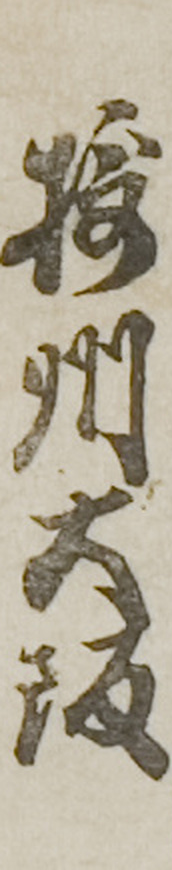摂州大阪
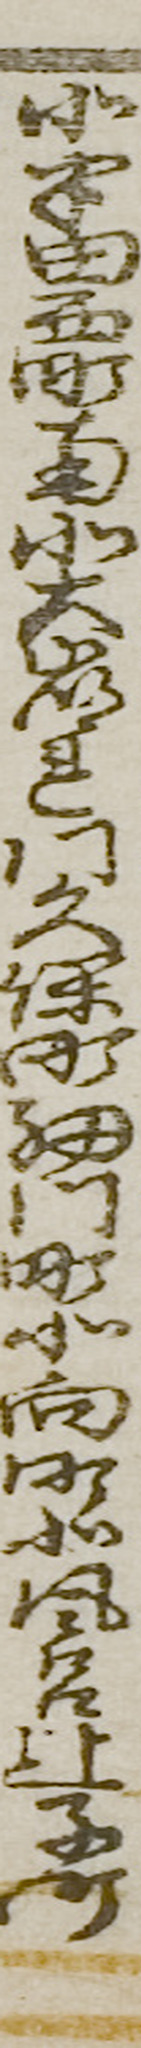北半田西町南北大崩れ川久保町細川町北向町北風呂辻子町
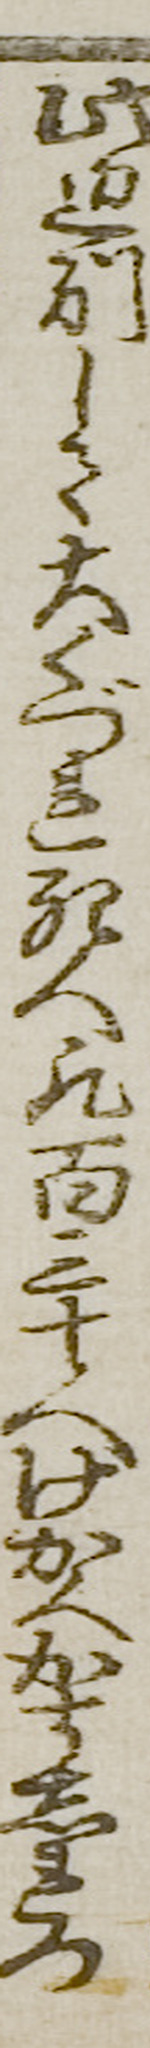此辺別して大くづれ死人凡百三十人けか人かすしれつ
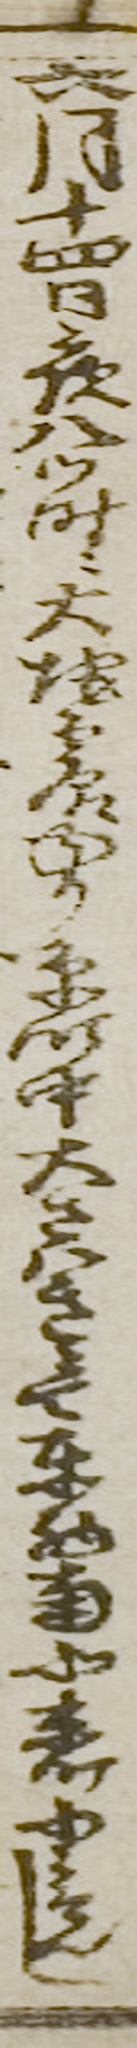六月十四日夜八つ時に大地震ゆり京町中大さはきにて東西南北末町少々そんし
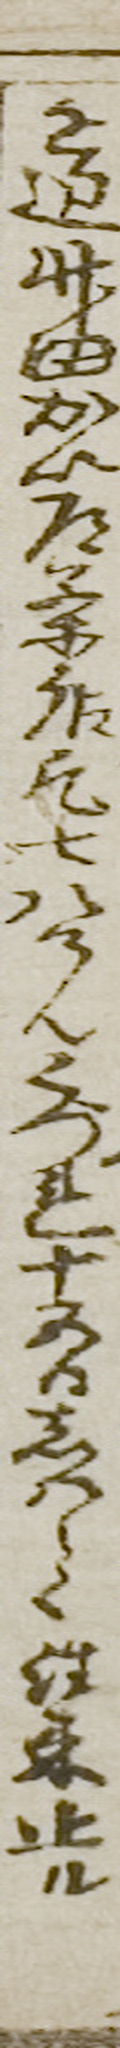近辺竹田かい道茶店凡七八けんくづれ十五日しはらく往来止る
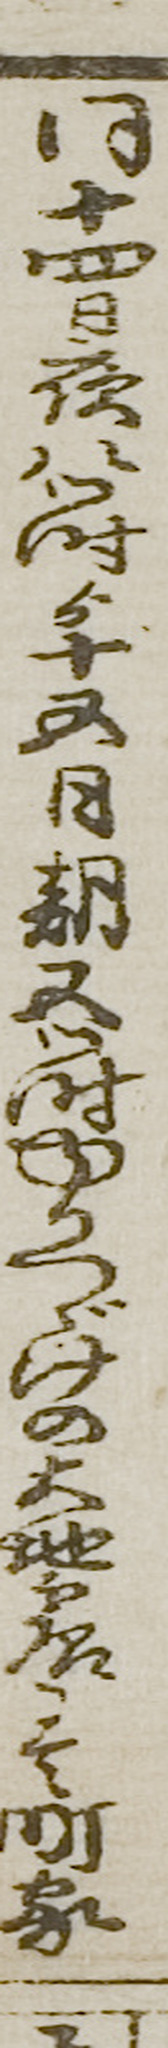同十四日夜八つ時より十五日朝五つ時ゆりつゞけの大地震にて町家
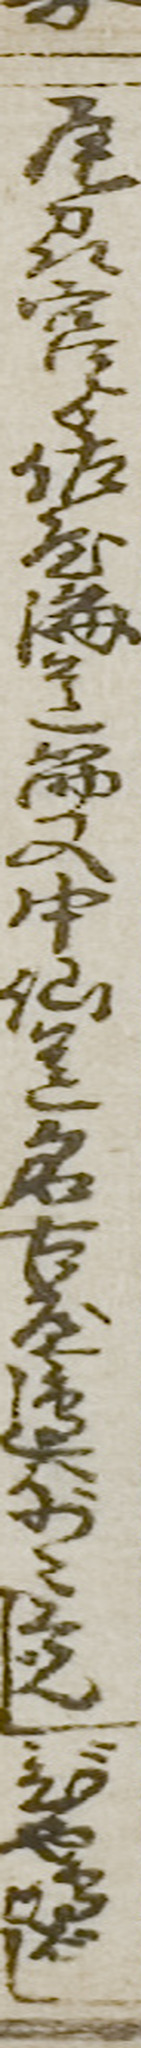尾州宮より佐屋海道筋又中仙道名古屋辺は少々そんじびや嶋ばし
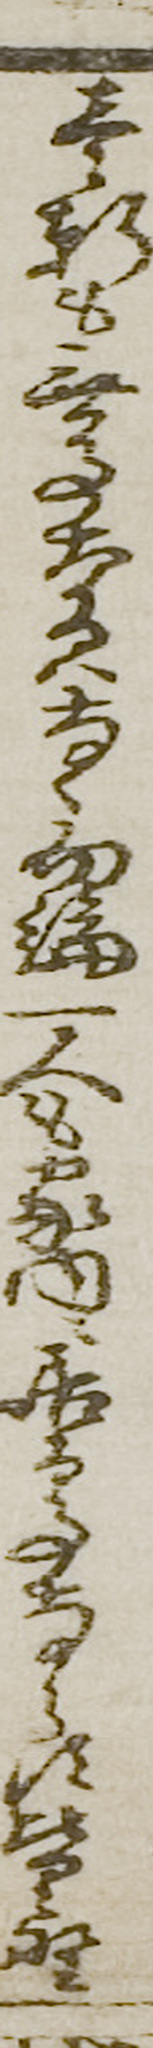壱軒も無事なるはなく勿論一人も家内に居る事ならす皆々野
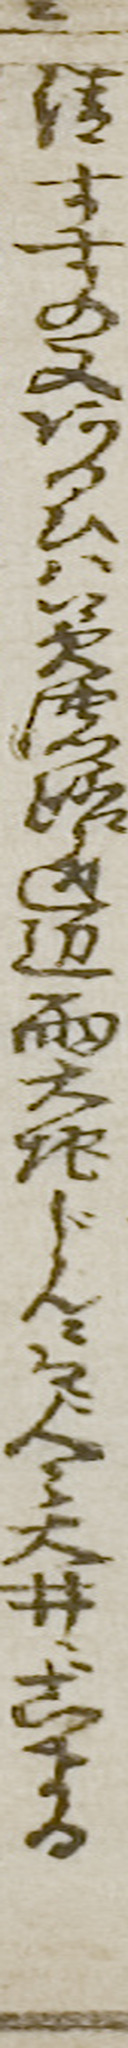清すすの又あるひは美濃路近辺雨大地じんに而人々大いにこまる
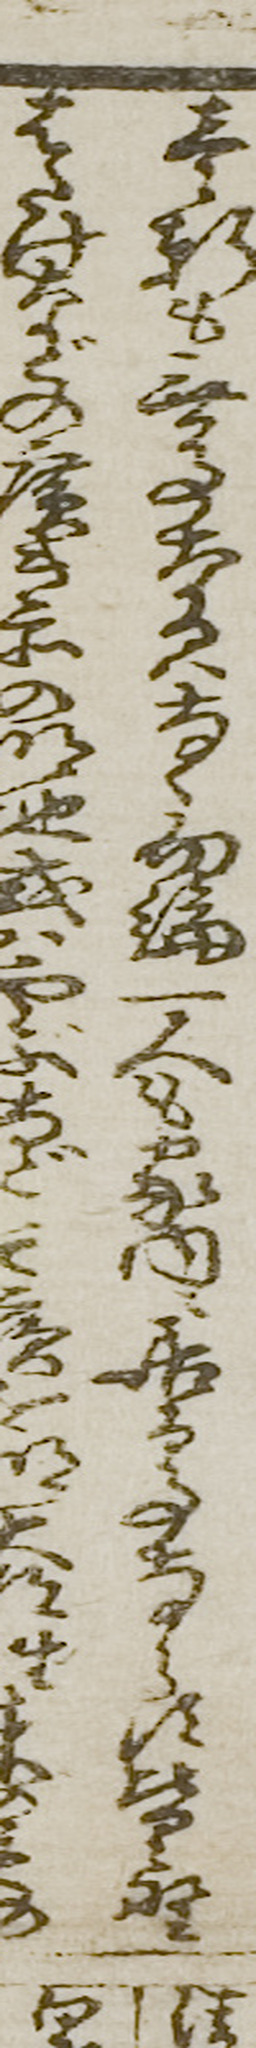はたけなどの広き所の明地或はやぶなどて夜を明し大道往来のもの
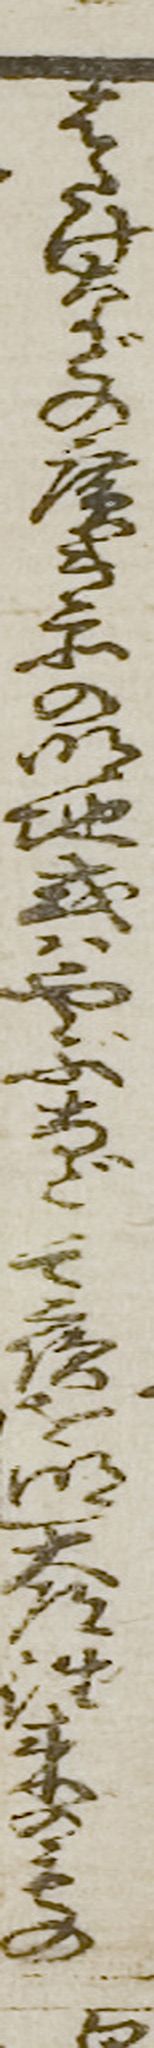はたけなどの広き所の明地或はやぶなどて夜を明し大道往来のもの
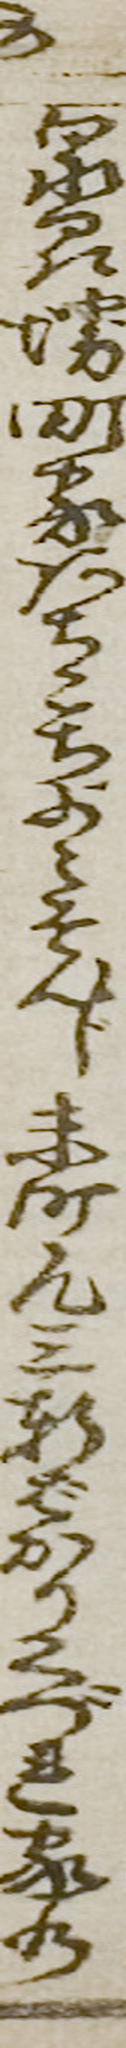泉州堺町家あちこち少々そんじ末町凡三軒ばかりくづれ家の
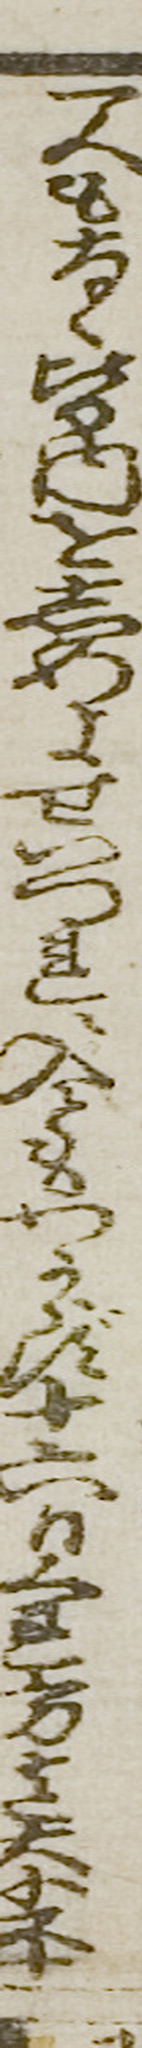一人もなく皆門をしめよせいつれに入ともわからず十六日くれ方迄大小五十
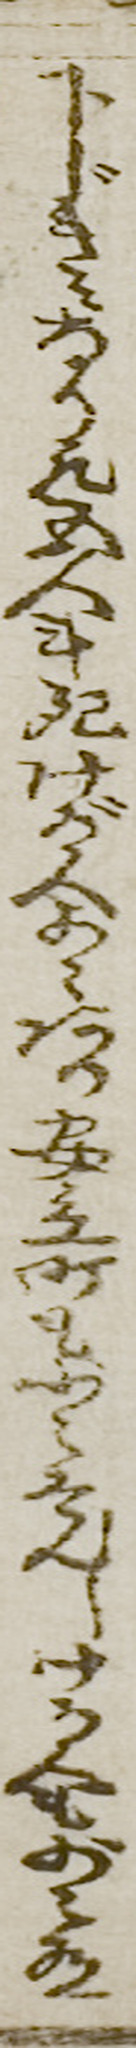下じきになり凡五人斗死けが人少々あり安立町も少々そんしけか人も少々有
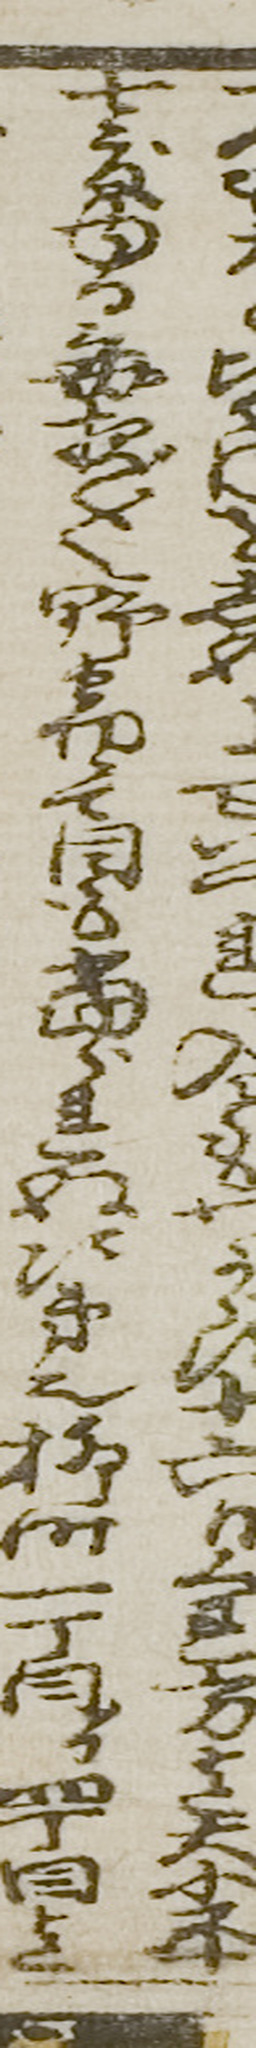七度ゆる毎夜〳〵野宿にて目も当てられぬ次第也柳町一丁目より四丁目迄
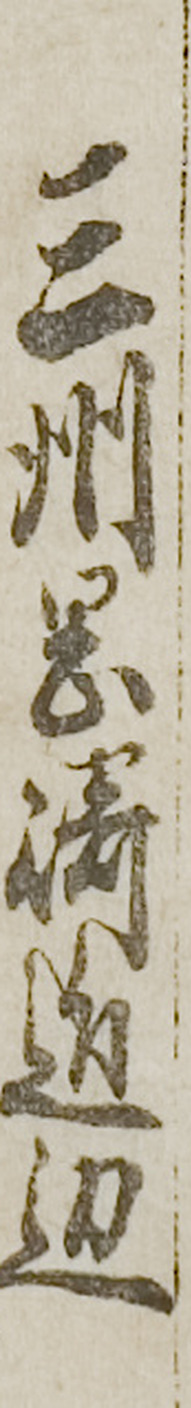三州岡崎近辺
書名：早飛脚廻りにてくわしき所本しらべ大地震
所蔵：東京大学総合図書館 General Library in the University of Tokyo, JAPAN
